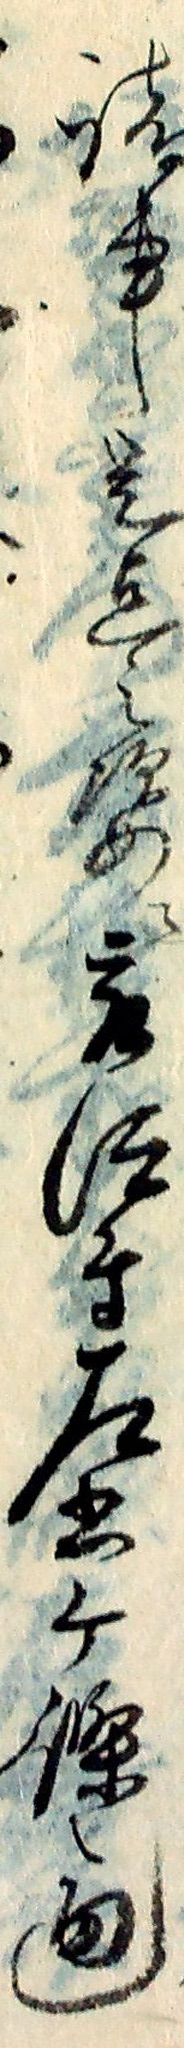諸事是迄之姿に被仰付左書ケ条之通
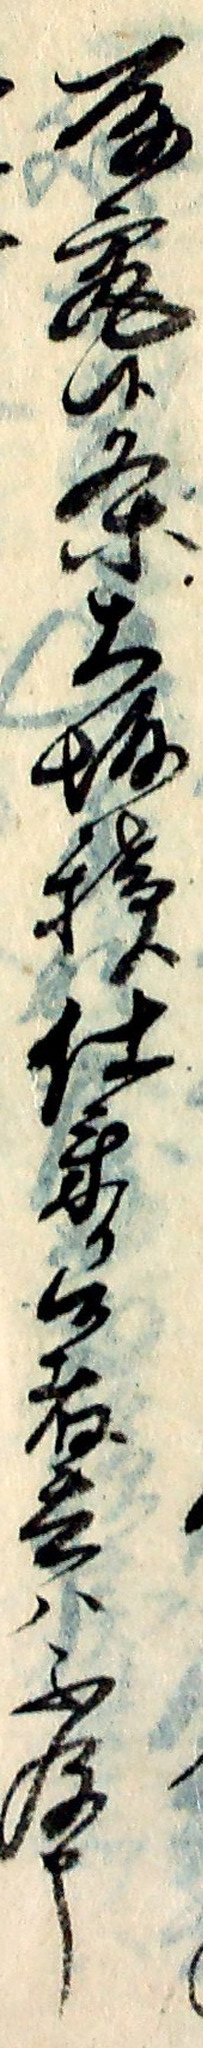取究候条大坂積仕来り候者共は不及申
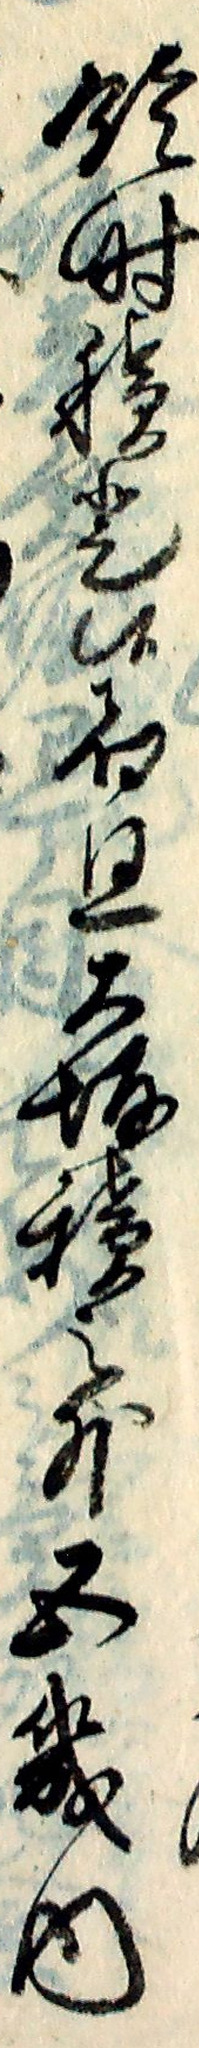臨時積登候者且大坂積之外五畿内
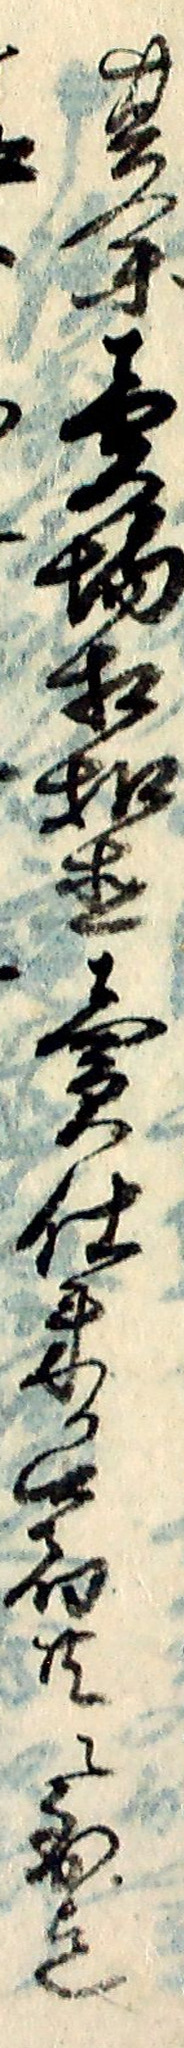其余売場相扣直売仕来り候者共に至迄
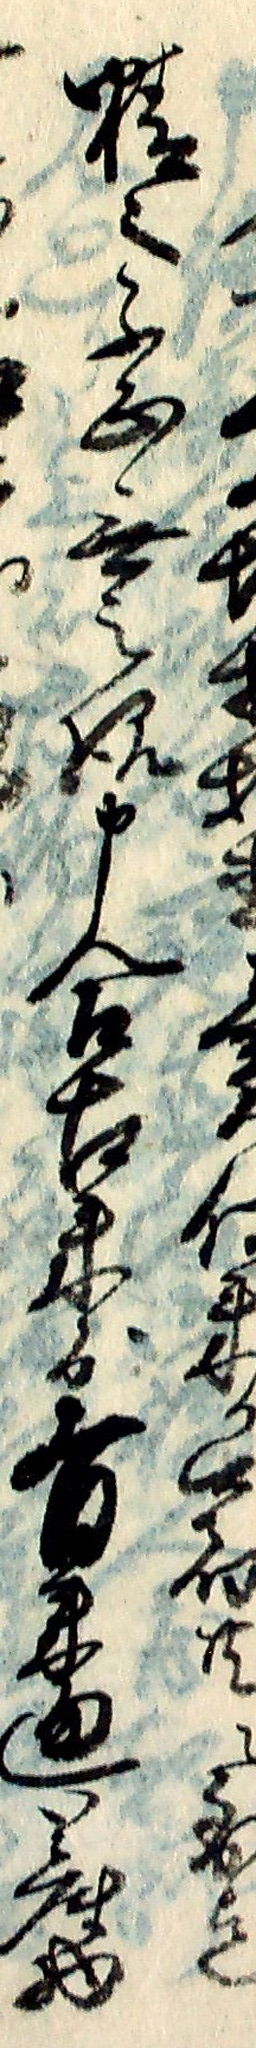精々不正無之様申合古来ゟ有来通御産物
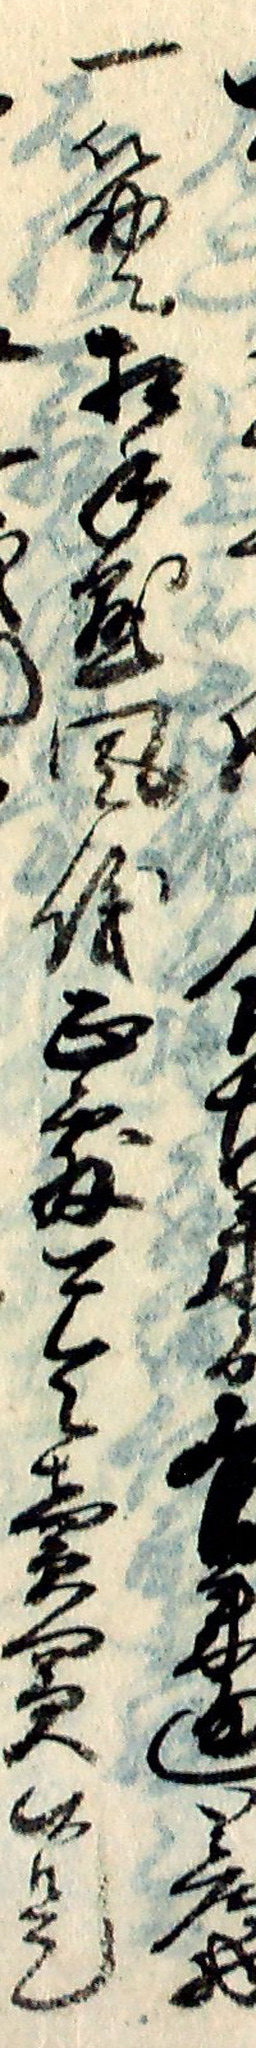一筋に相手懸風儀正敷可令売買候是
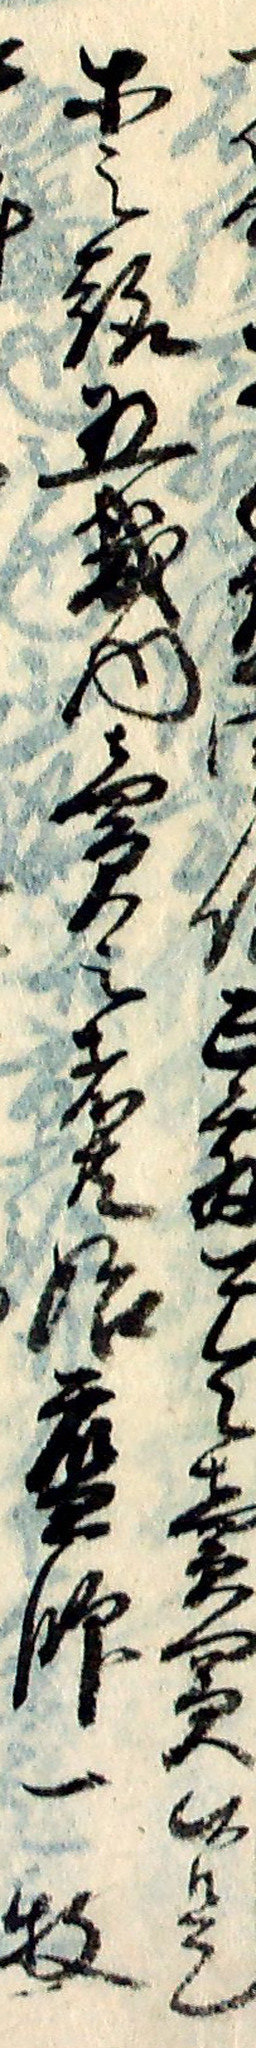等之趣五畿内売之者共始藍師一牧
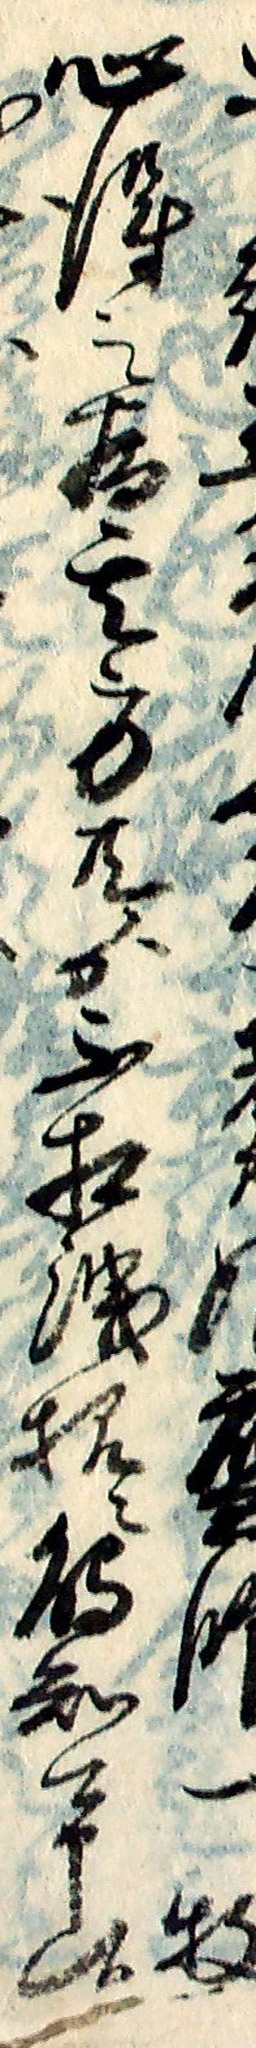心得之為其方共ゟ不相洩様に触知可申候
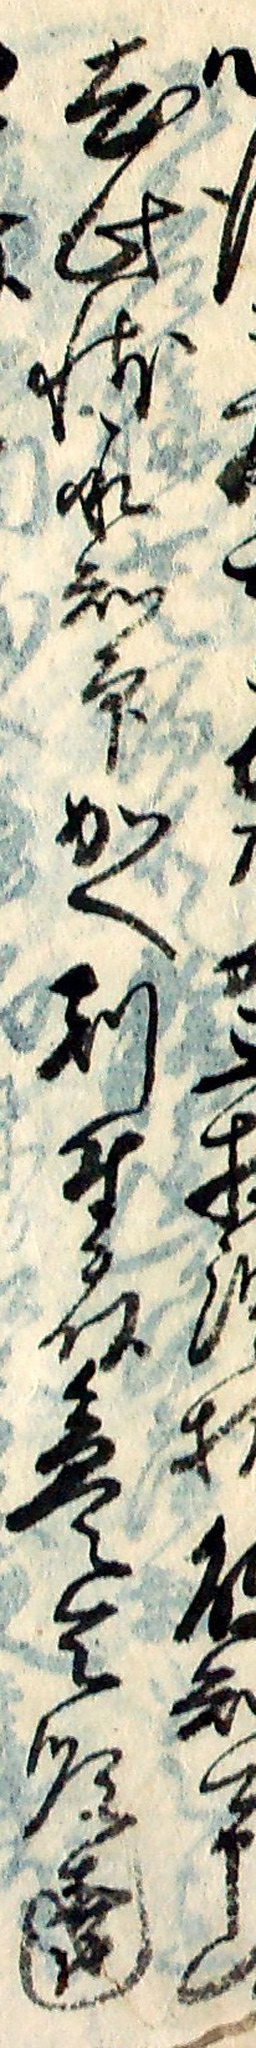尤此状承知印加へ刻付を以急々令順達
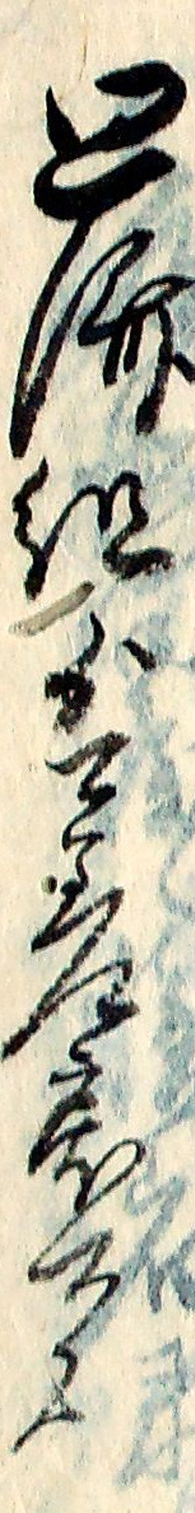廻済組ゟ可差戻候以上

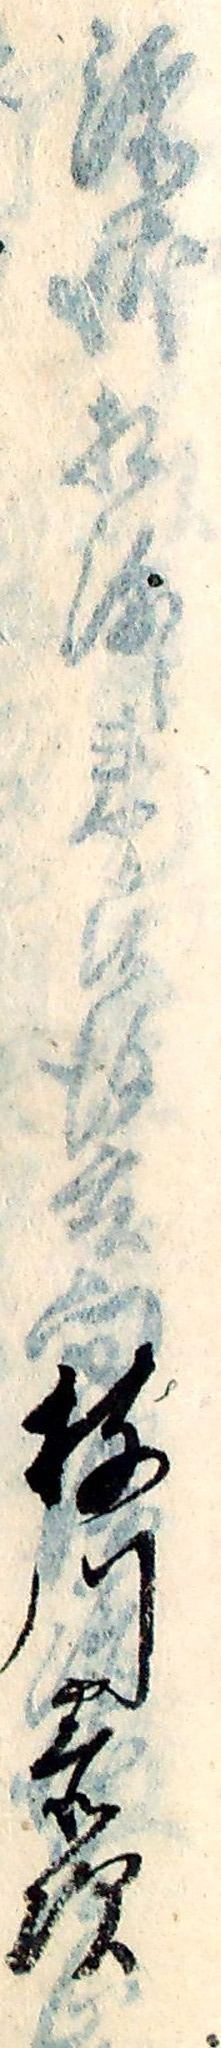枝川泰次
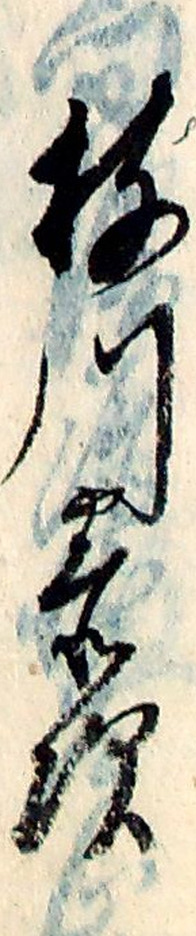枝川泰次
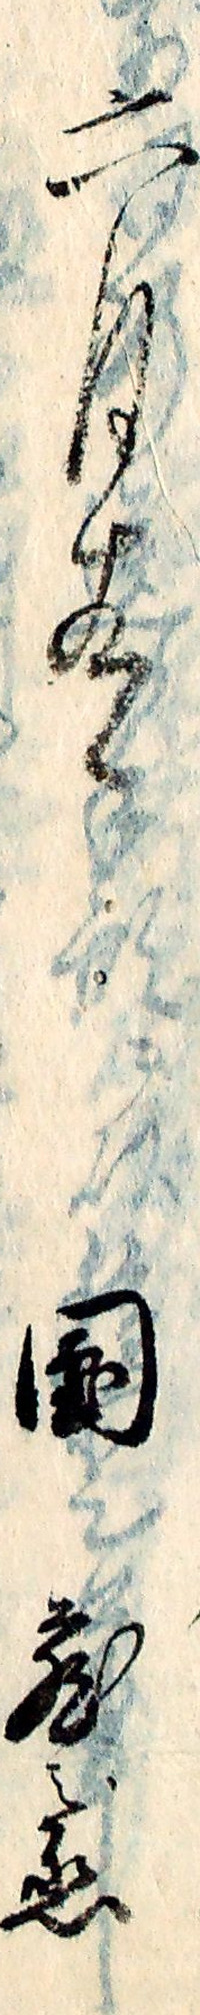六月十九日団蔵之助
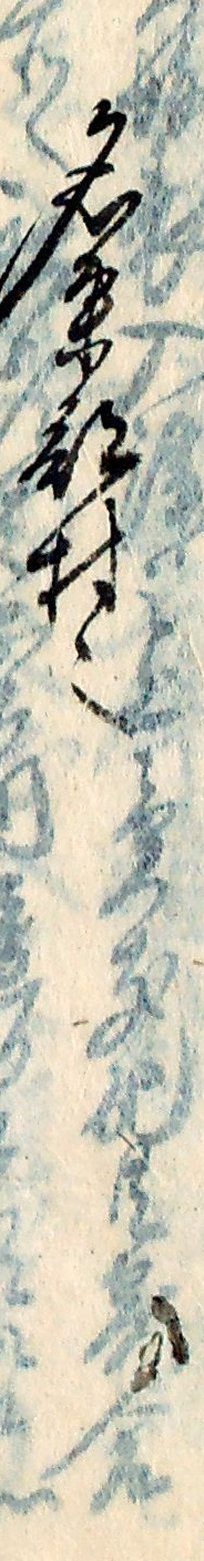名東郡村々
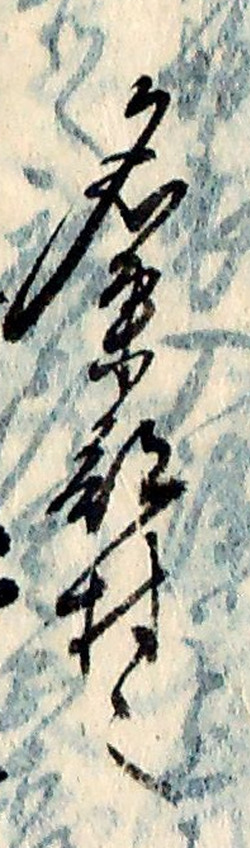名東郡村々
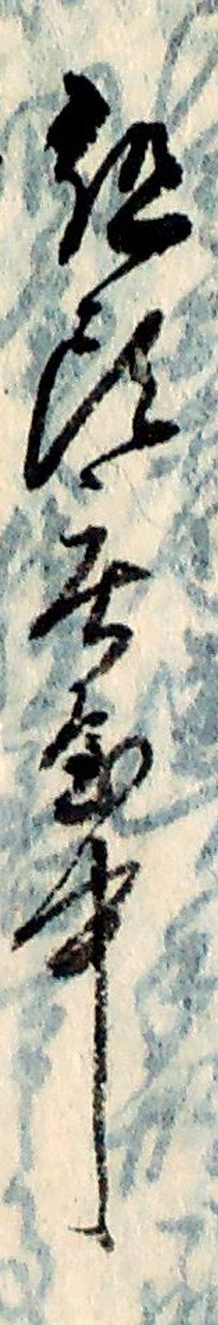組頭庄屋中
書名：諸御願書控(後藤氏壱番）
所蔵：鳴門教育大学 Naruto University of Education
